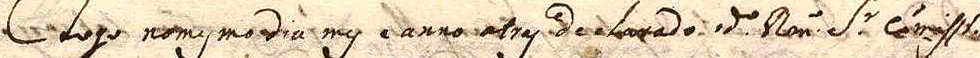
E Logo no mesmo dia mes e anno atras decLarado o d.o Rm̄. S.r com̄ssr.o
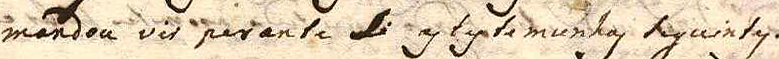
mandou vir perante si as testemunhas seguintes.
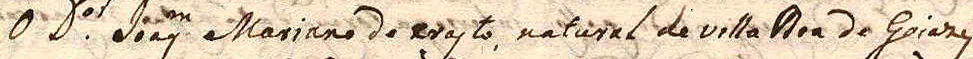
O D.or Ioaq.m Mariano do crasto, natural de villa Boa de Goiazes
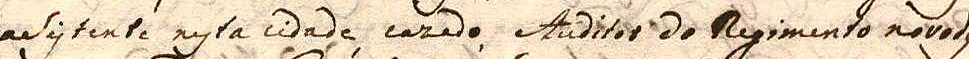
asistente nesta cidade, cazado, Auditor do Regimento novo des
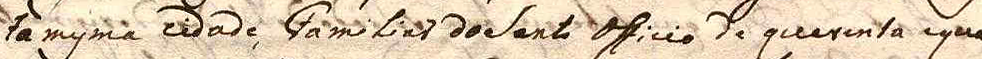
ta mesma cidade, FamiLiar do Santo Officio de quarenta e qua
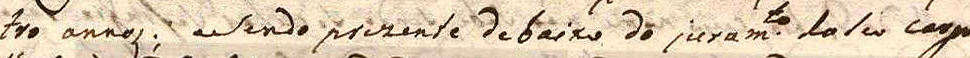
tro annoz; e sendo prezente debaixo do juram.to do seo cargo
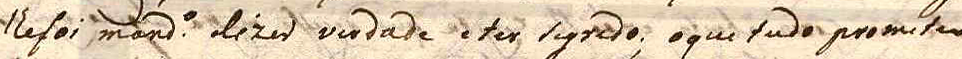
lhe foi mand.o dizer verdade e ter segredo; o que tudo prometeo
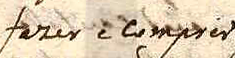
fazer e comprir;
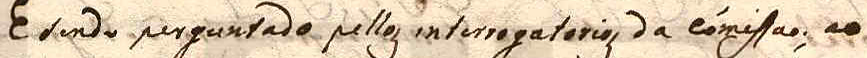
E sendo perguntado pelloz interrogatorioz da com̄issao; ao
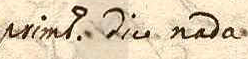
primr.o dice nada
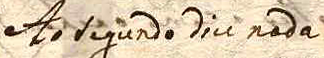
Ao segundo dice nada
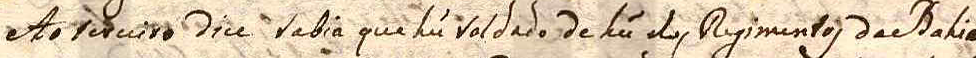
Ao terceiro dice sabia que hū soldado de hū dos Regimentos da Bahia
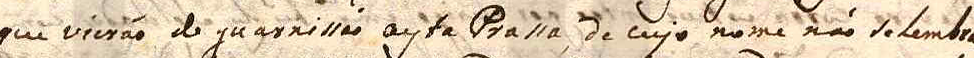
que vierão de guarnissão a esta Prassa, de cujo nome não se Lembra
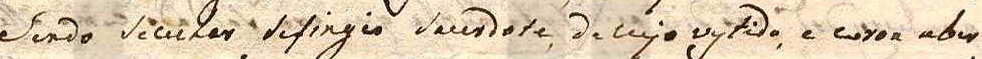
sendo secular se fingio sacerdote, de cujo vestido, e coroa aber
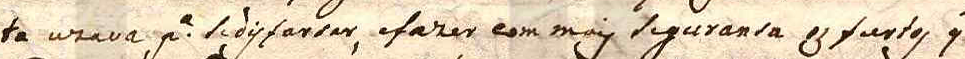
ta uzava p.a se disfarsar, e fazer com mais seguransa oz furtos q̄
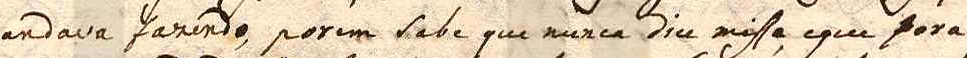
andava fazendo, porem sabe que nunca dice missa, e que fora
